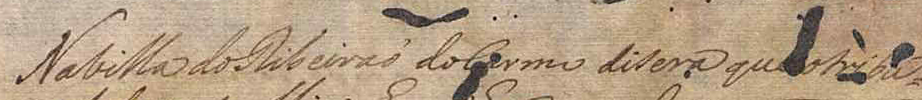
Na villa do Ribeiraõ do Carmo disera que o tribu
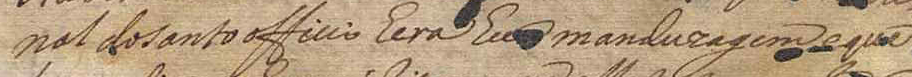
nal do santo officio hera hu_ manduzagem e que
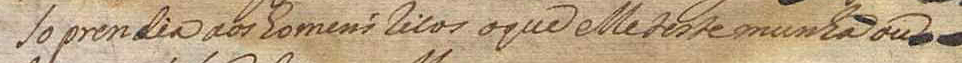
so prendia aos homens Ricos o que elle testemunha ou
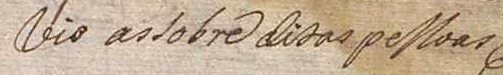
Vio as sobreditas pessoas
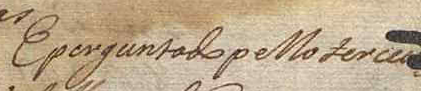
E perguntado pello tercei
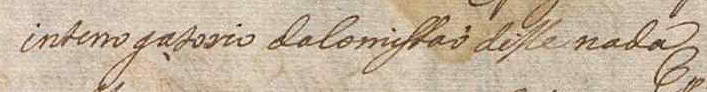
interrogatorio da Comissaõ disse nada
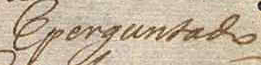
E perguntado
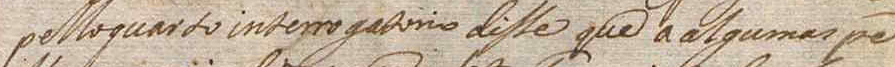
pello quarto interrogatorio disse que a algumas pe
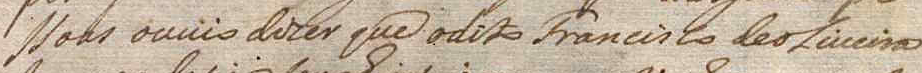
ssoas ouuio dizer que o dito Francisco de oLiueira
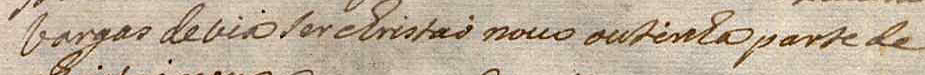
vargas devia ser christaõ nouo ou tinha parte de
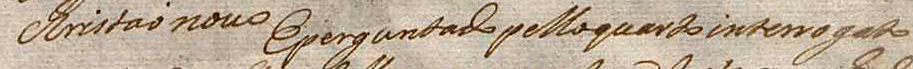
christaõ nouo E perguntado pello quarto interrogato
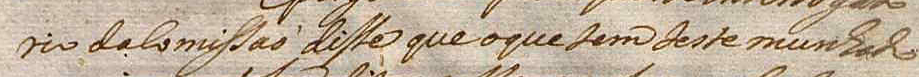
rio da Comissaõ disse que o que tem testemunhado
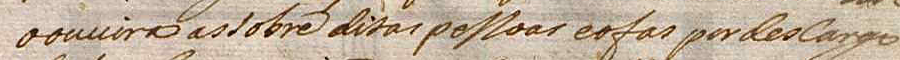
o ouuira as sobreditas pessoas e o fas por desCargo
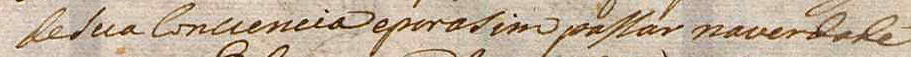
de sua Conciencia e por asim passar na verdade
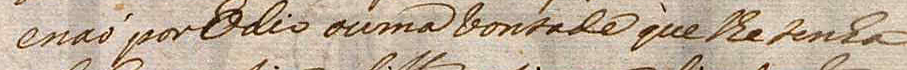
e naõ por Odio ou ma vontade que lhe tenha
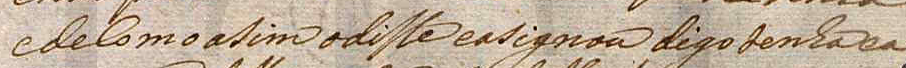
e de Como asim o disse e asignou digo tenha e a
